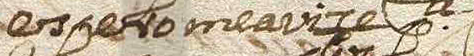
espero me avize p.a
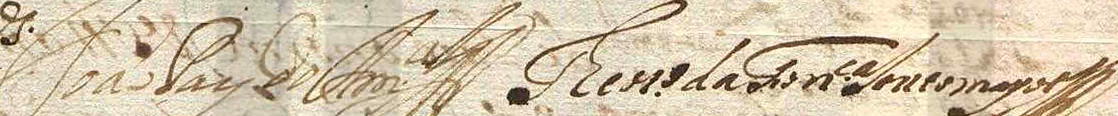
Joaõ Paes do Am.al Theot.o da Fon.ca Souto mayor
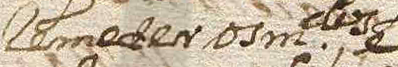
Remeder os m.dos, e
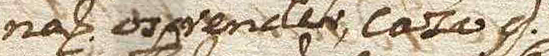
naõ os prender, caza q̄.
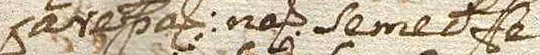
paressaõ: naõ se me offe
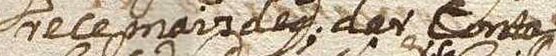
rece mais de q̄; dar Conta
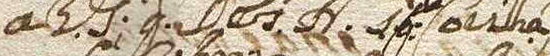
a V. S; q̄. Des̄ N. s.or g:de Covilhã,
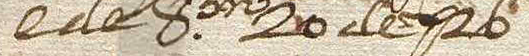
e de 8.bro 20 de 726
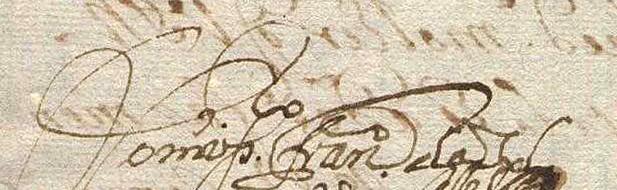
O Comiss.o Fran.co da syl
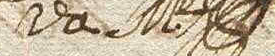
va M.el
